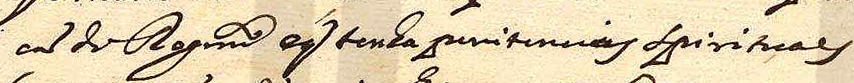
çaõ do Regim.to e q̄ tenha penitencias spirituaes
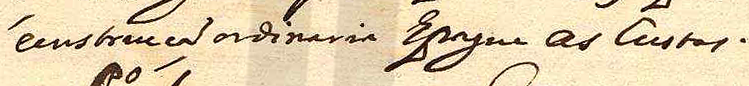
e instrucçaõ ordinaria E pague as Custas.
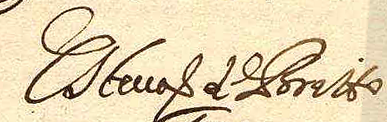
Esteuaõ de Britto
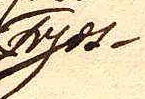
Fojos
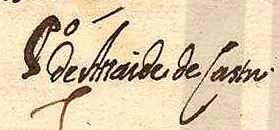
Po de Ataide de Castro.
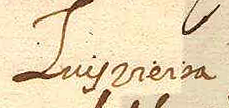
Luis vieira
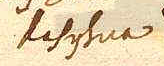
da sylua
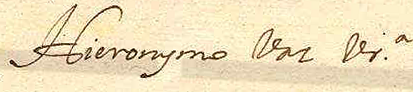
Hieronymo Vaz Vr.a
